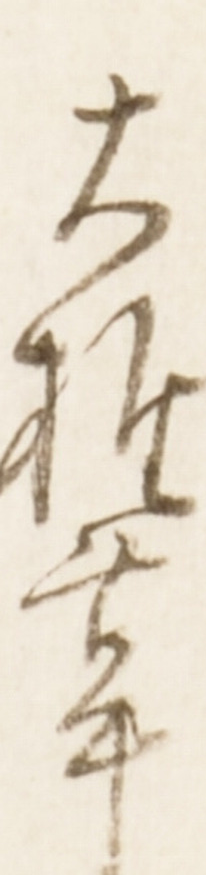大椎茸
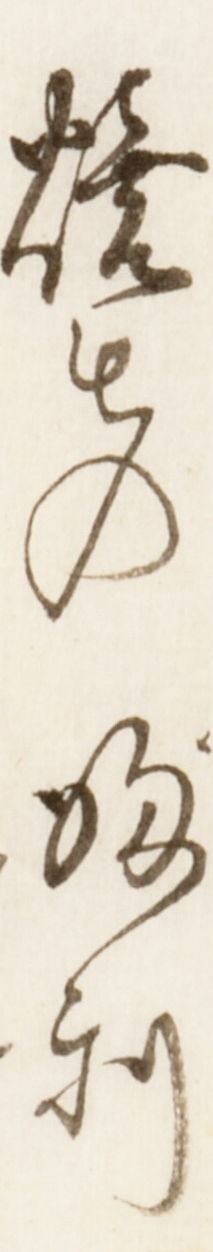焼ものぶり
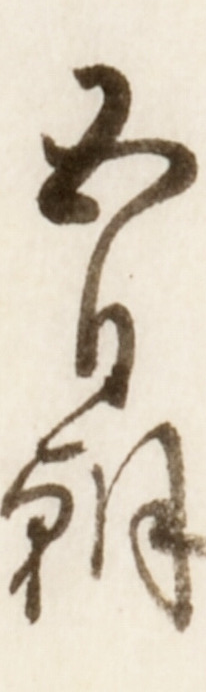五日朝
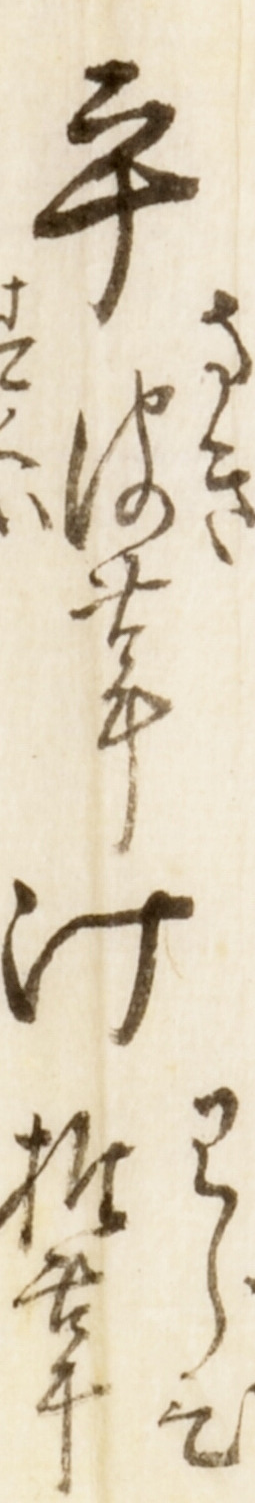平波茸汁椎茸
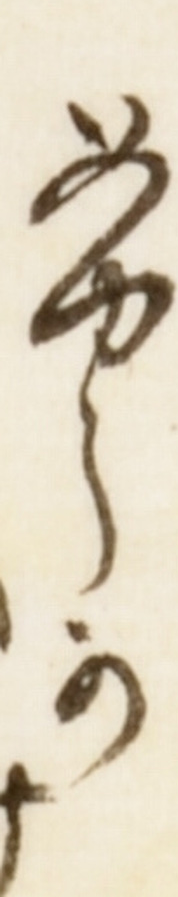しやうか
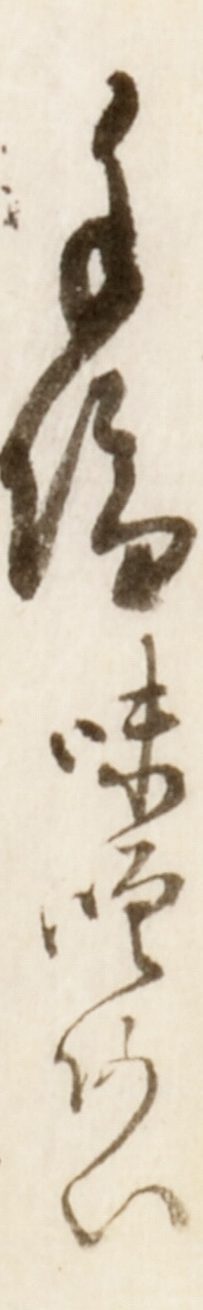手塩味噌あい
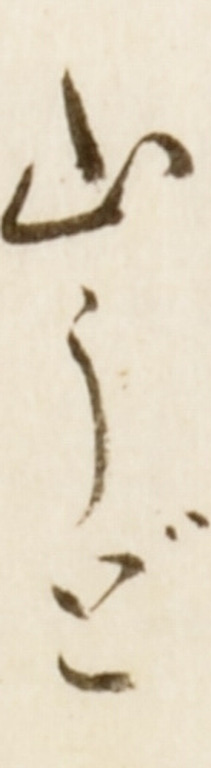山うど
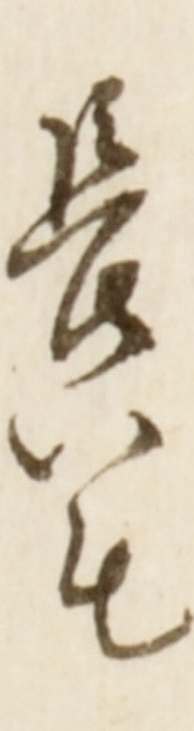長いも

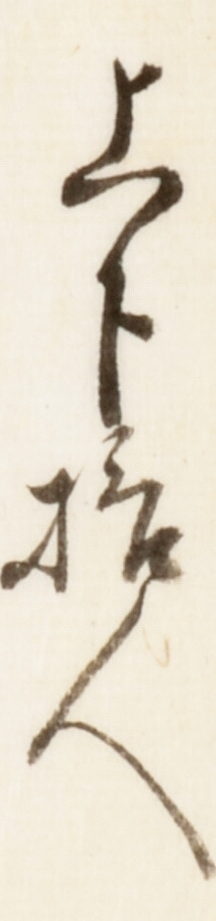上下拾人
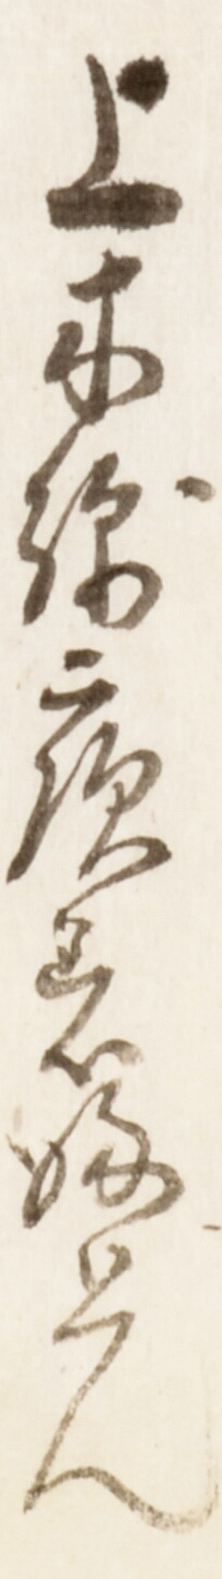上木綿夜着ふとん
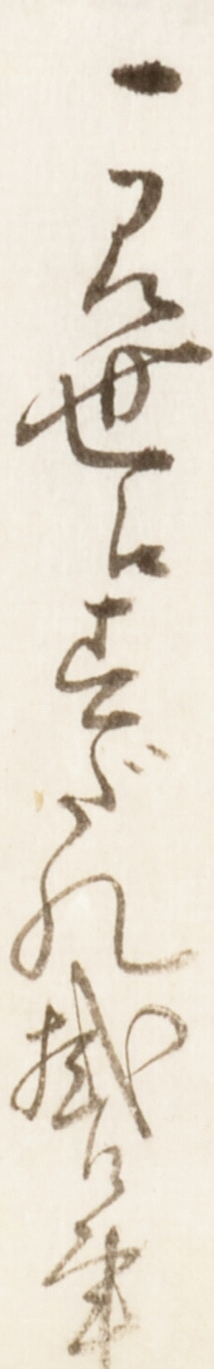一見世えすだれ掛候事
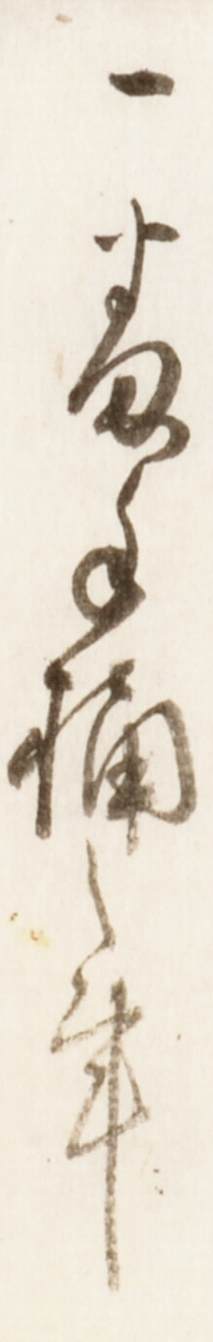一番手桶之事
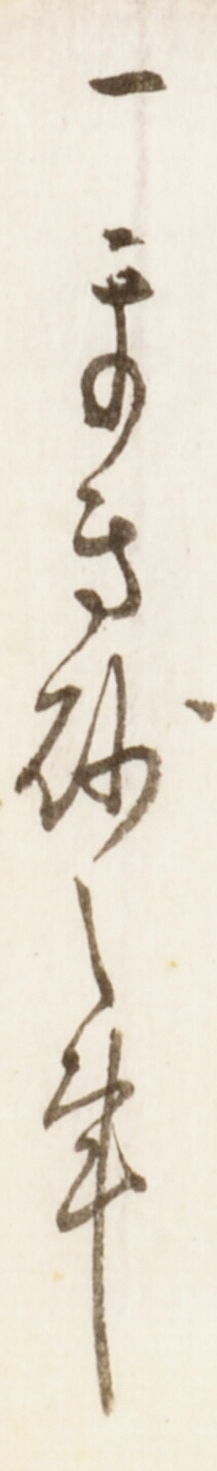一まき砂之事
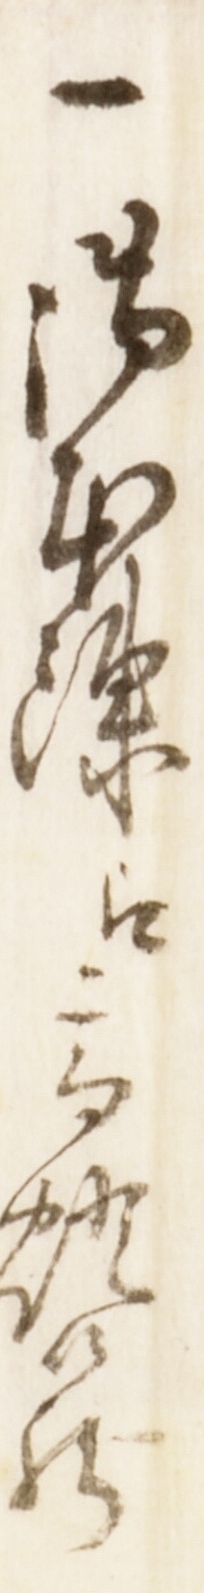一御本陣え高燈籠
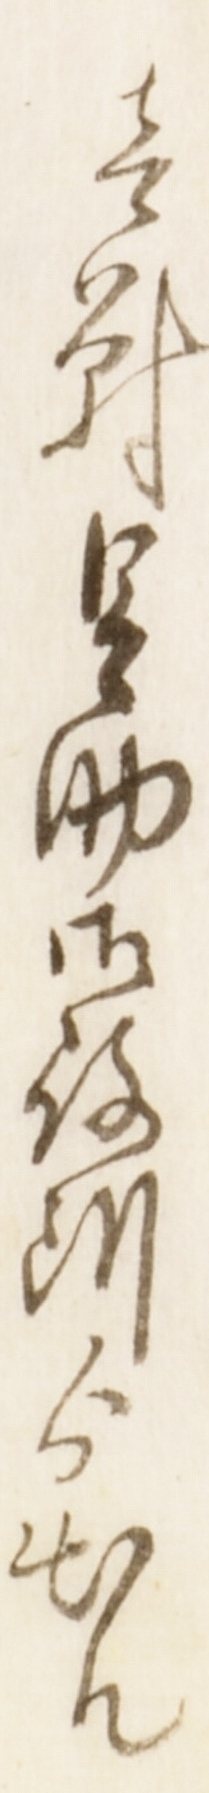壱対足助御役所ゟ出る
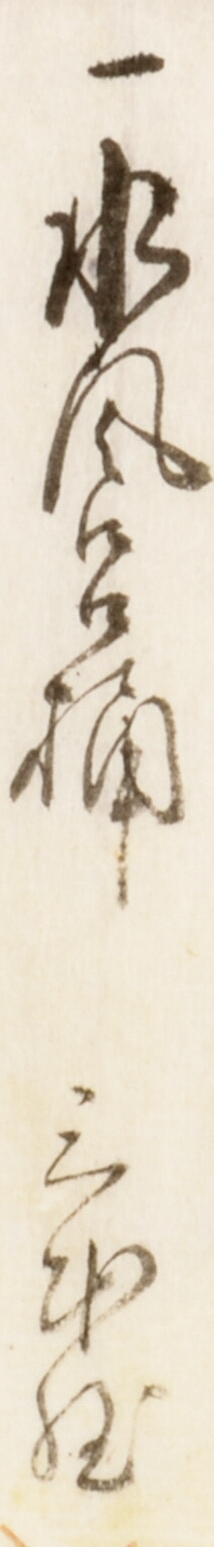一水風呂桶三本程
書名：（諸事控）
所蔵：伊那市立高遠町図書館・合同会社AMANE
